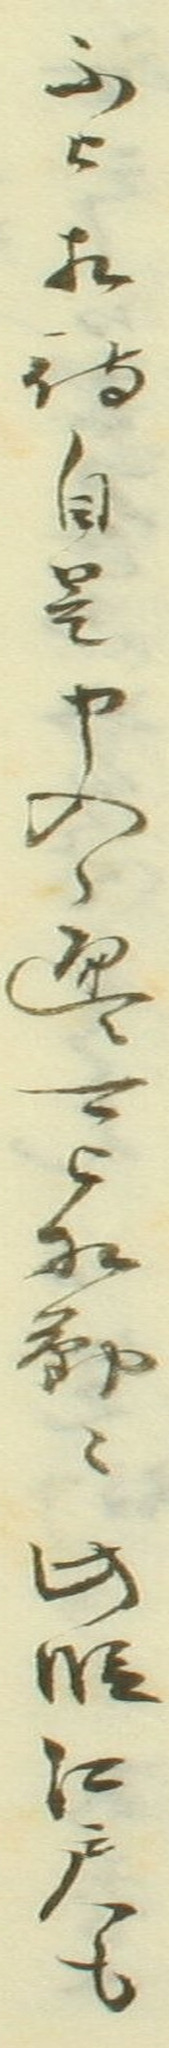不被相待自是申入候通に可被相勤候此段江戸へも
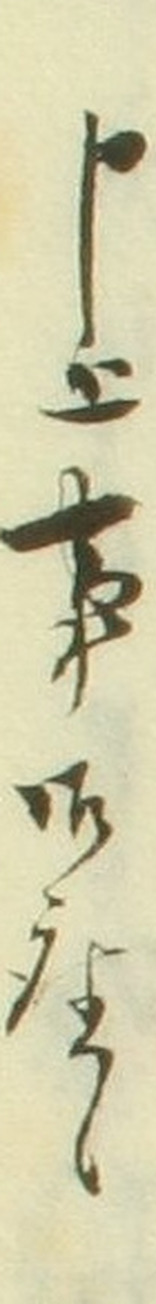申上事御座候
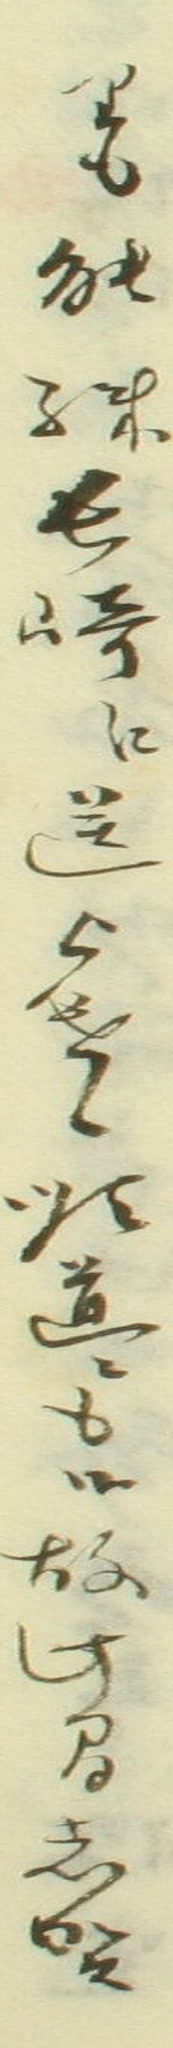りも能殊長崎え送被遣候順道にも候故此間志賀
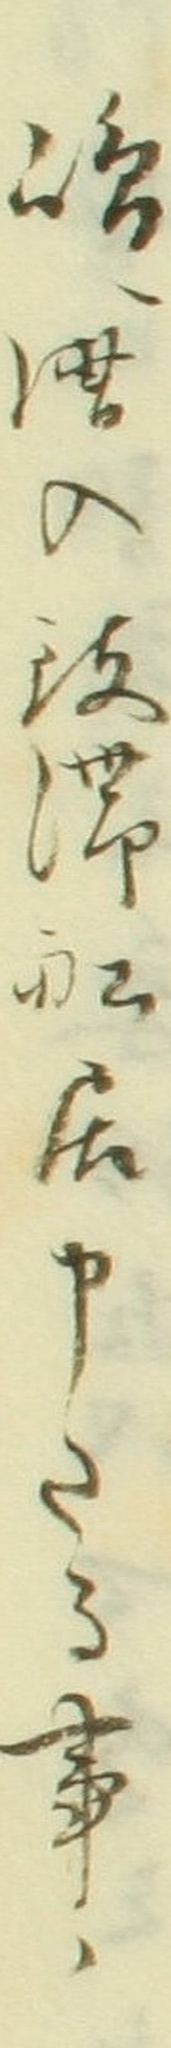島へ漕入致滞船居申たる事
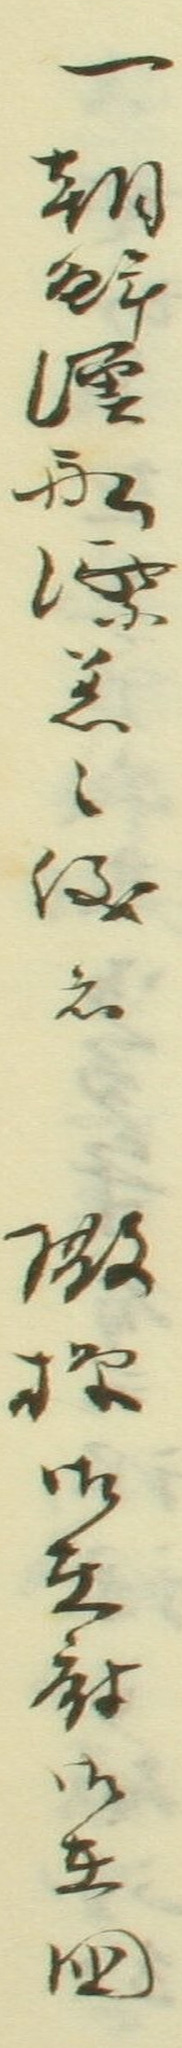一朝鮮漁船漂着之儀は殿様御在府御在国

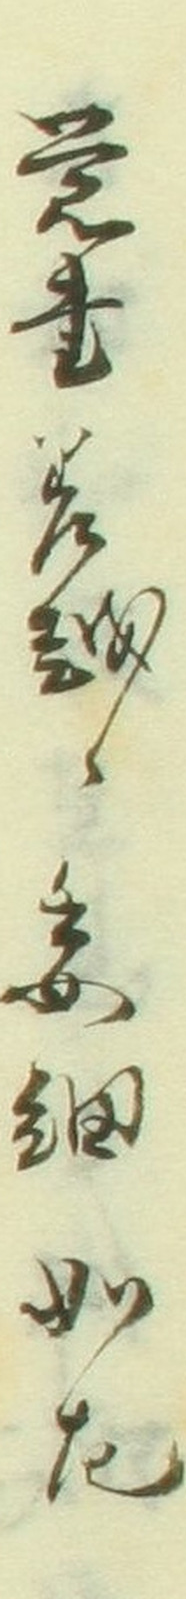覚書差越候委細如左
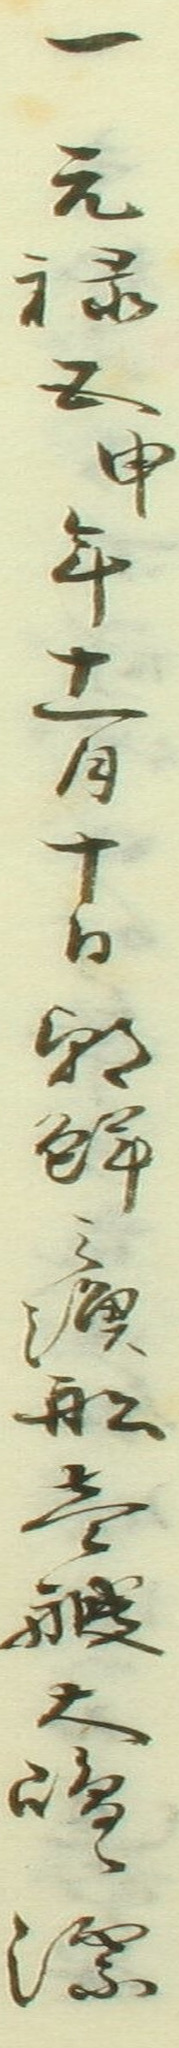一元禄五申年十一月十日朝鮮之漁船壱艘大島へ漂
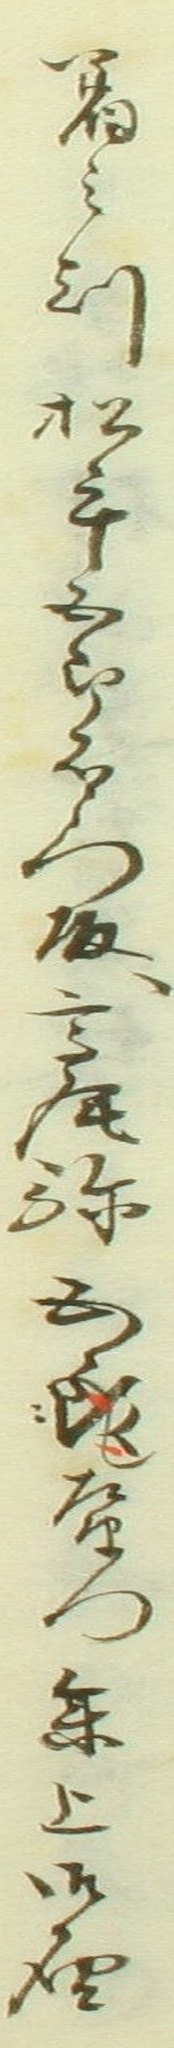着之刻松平五郎右衛門殿へ高尾弥五左衛門参上御届
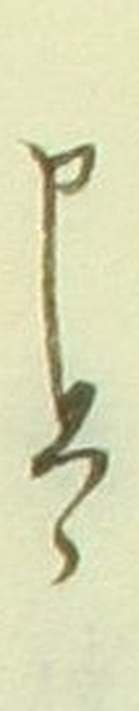申上候
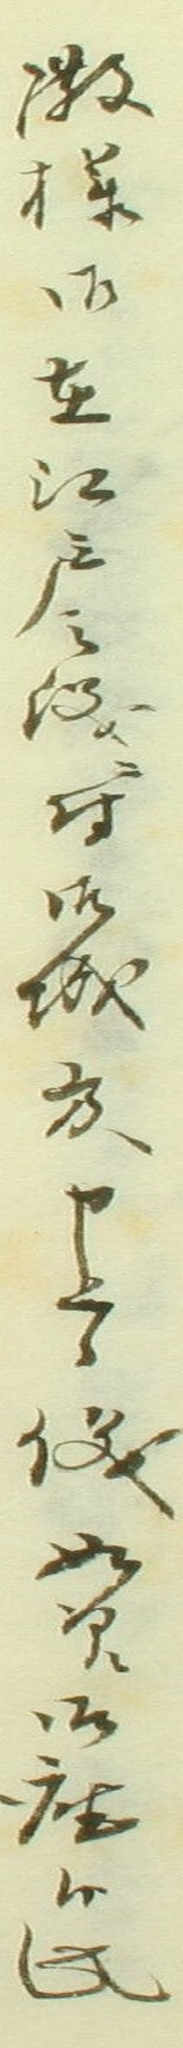殿様御在江戸之儀に付御城方へ申上候儀如何に御座候此
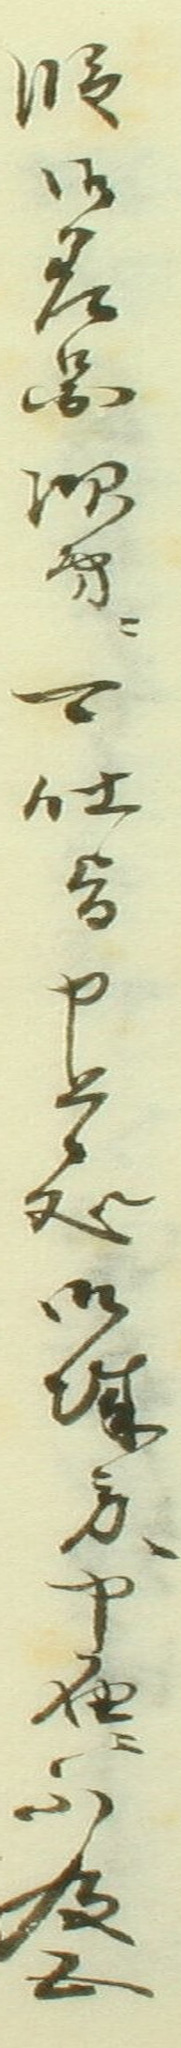段御差図次第に可仕旨申上候処御城方へ申届に不及五
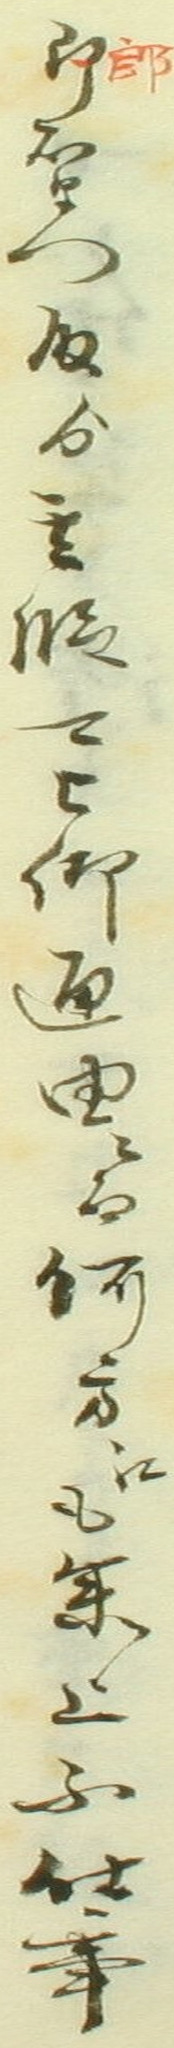郎右衛門より其段可被仰通由にて何方えも参上不仕候
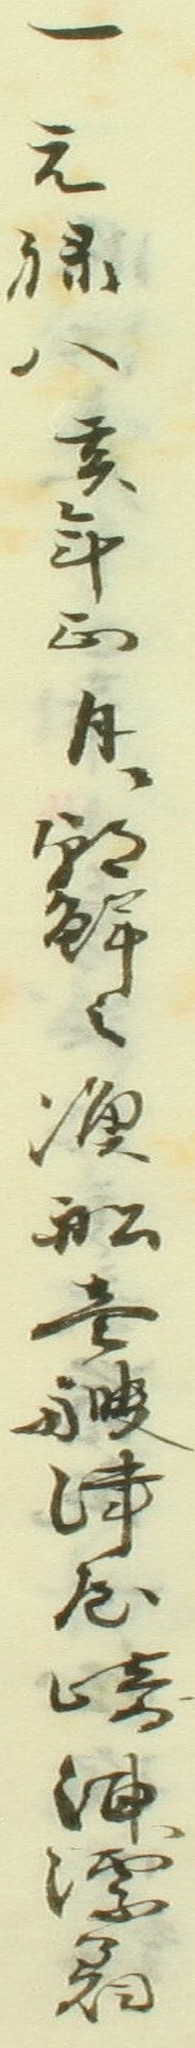一元禄八亥年正月に朝鮮之漁一艘津屋崎浦漂着
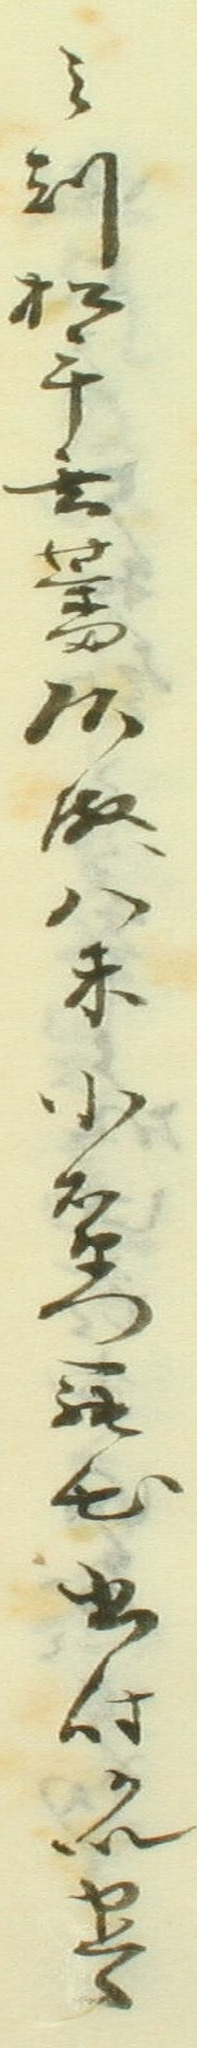之刻松平玄蕃殿へ八未小右衛門罷出書付を以申上候
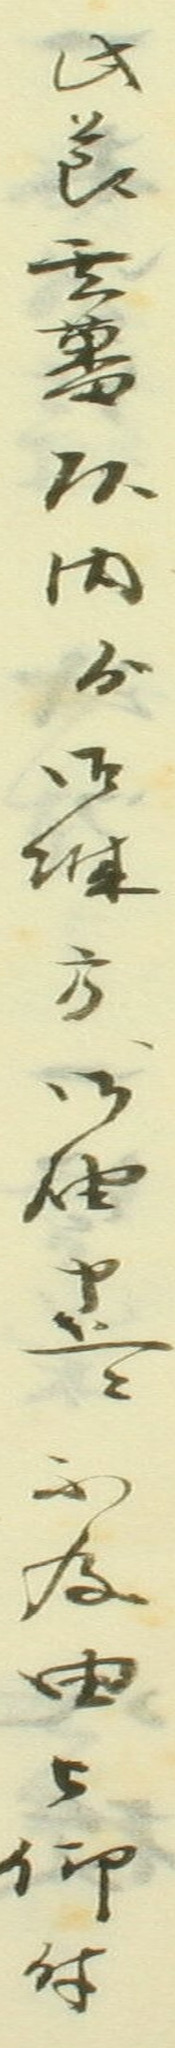此節玄蕃頭内より御城方へ御届申上に不及由被仰付
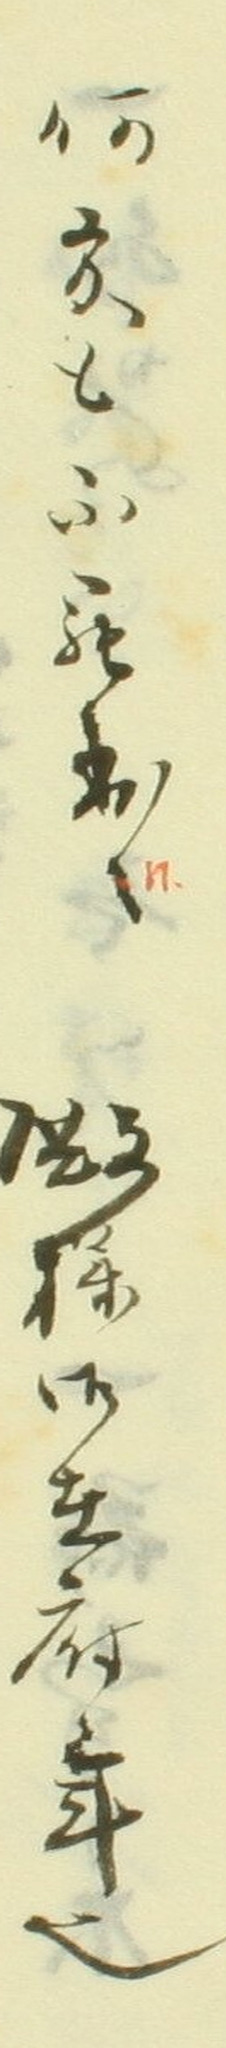何方へも不罷出候殿様御府年也
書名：朝鮮船御領内漂流記 坤
